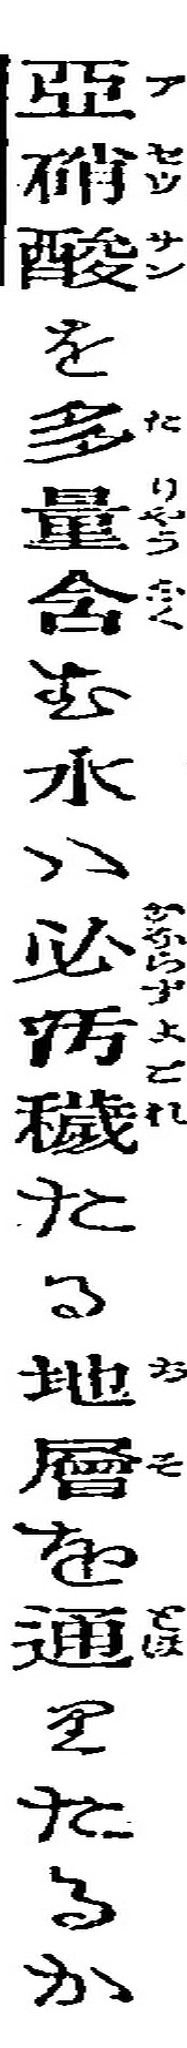亞硝酸を多量含む水は必汚穢たる地層を通りたるか

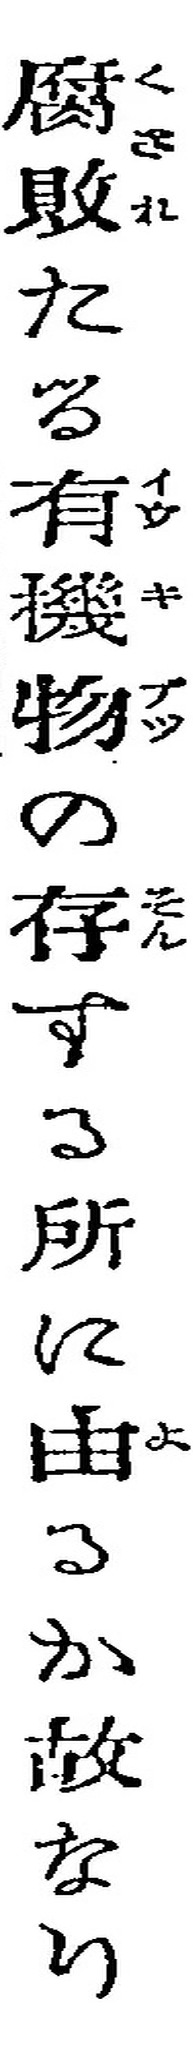腐敗たる有機物の存する所に由るか故なり
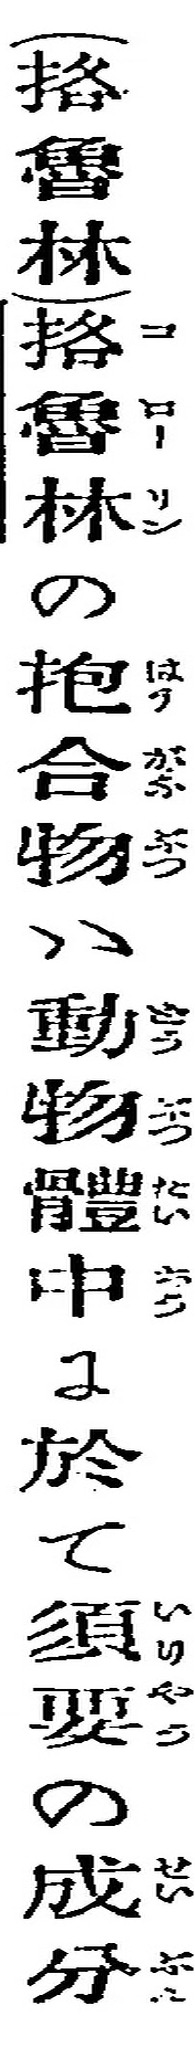[挌魯林]挌魯林の抱合物は動物體中に於て須要の成分
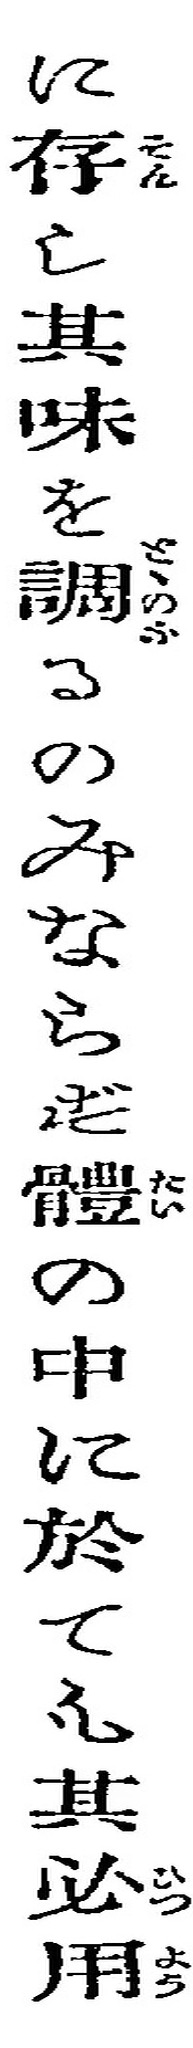に存し其味を調るのみならず體の中に於ても必要
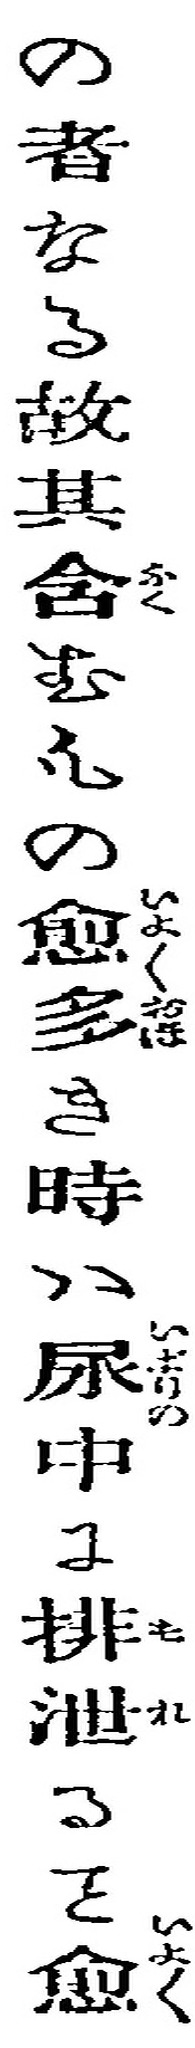の者なる故其含むもの愈々多き時は尿中に排泄ること愈々
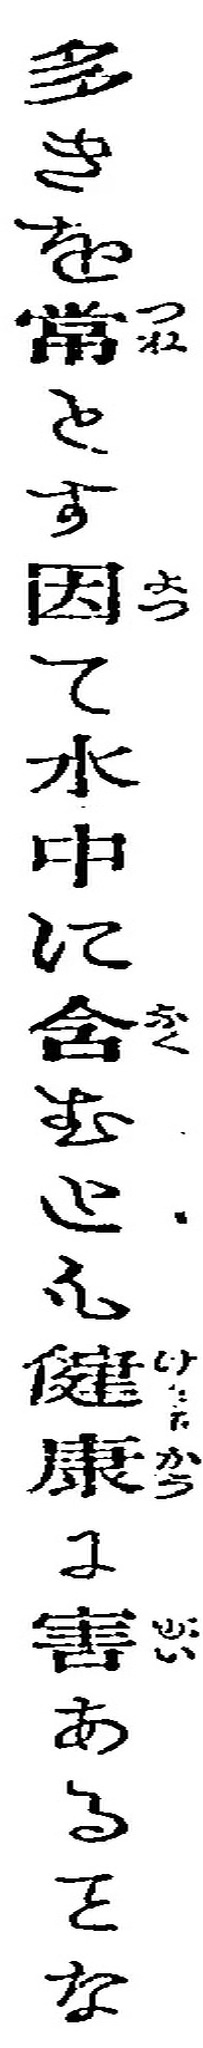多きを常とす因て水中に含むとも健康に害あることな
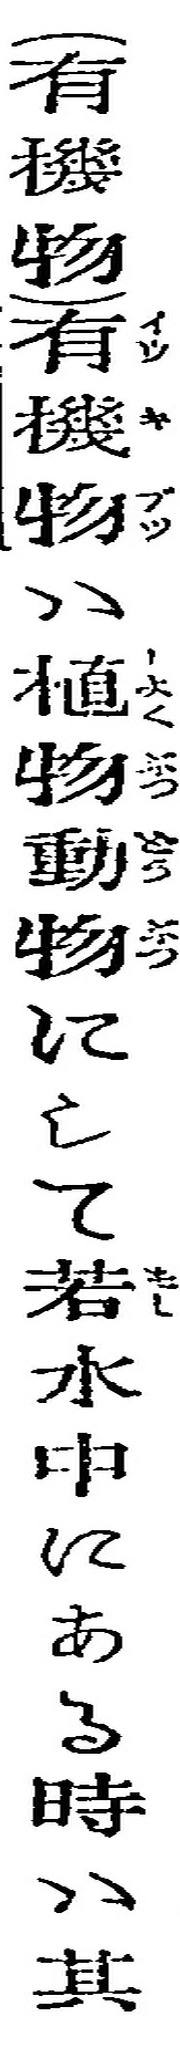[有機物]有機物は植物動物にして若水中にある時は其
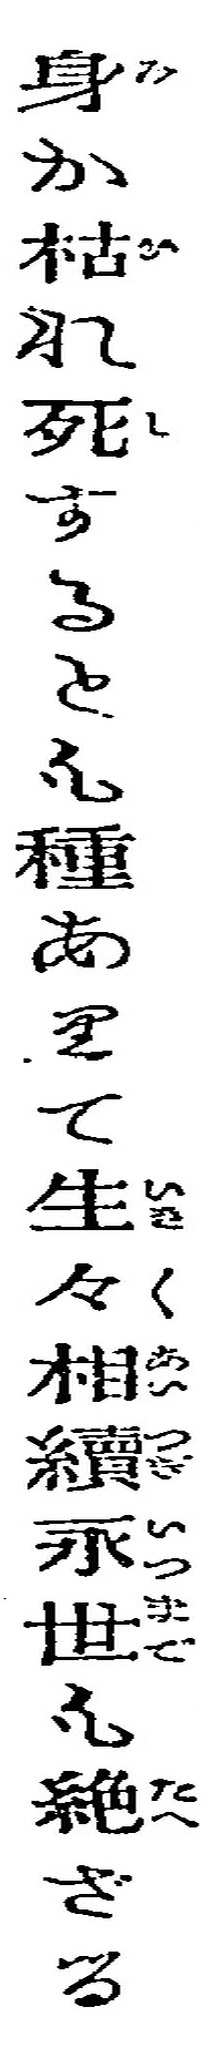身か枯れ死するとも種ありて生々相続永世も絶ざる
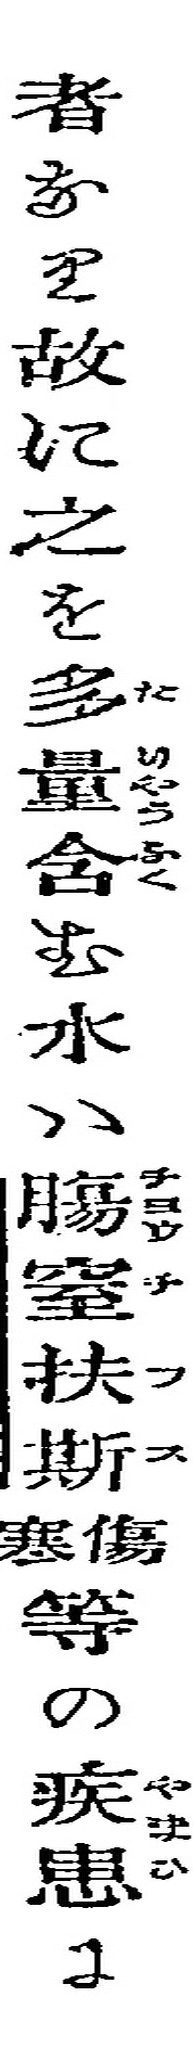者なり故に之を多量含む水は膓窒扶斯傷寒等の疾患に
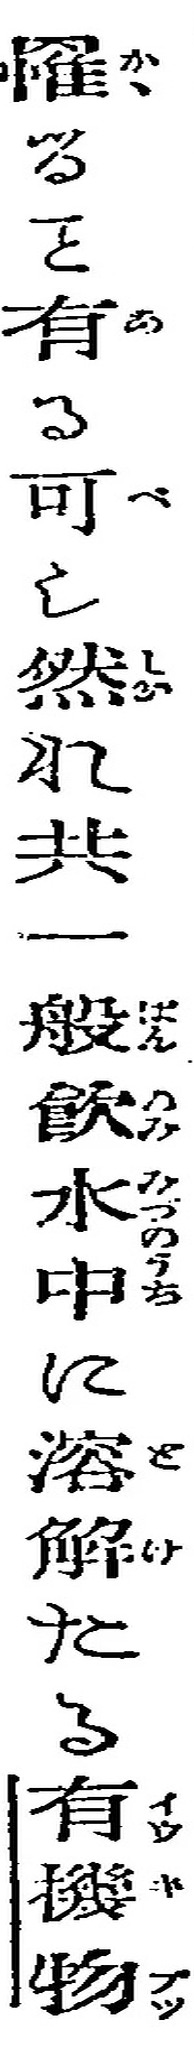罹ること有る可し然れ共一般飲水中に溶解たる有機物
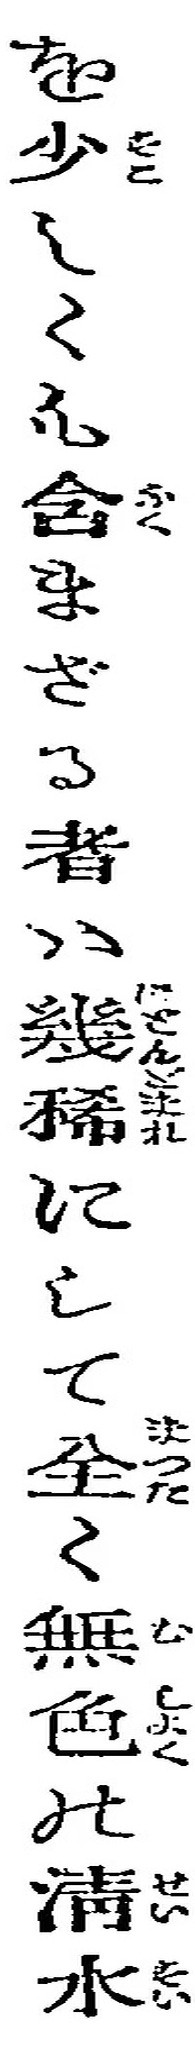を少しくも含まざる者は幾稀にして全く無色の清水
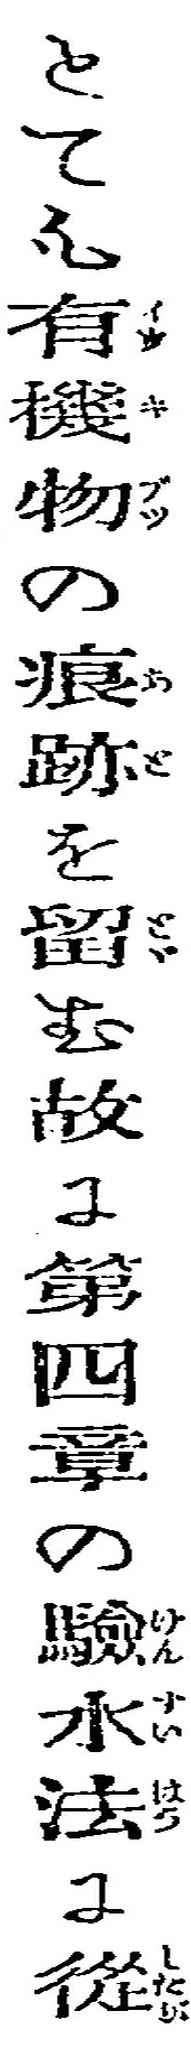とても有機物の痕跡を留む故に第四章の験水法に従
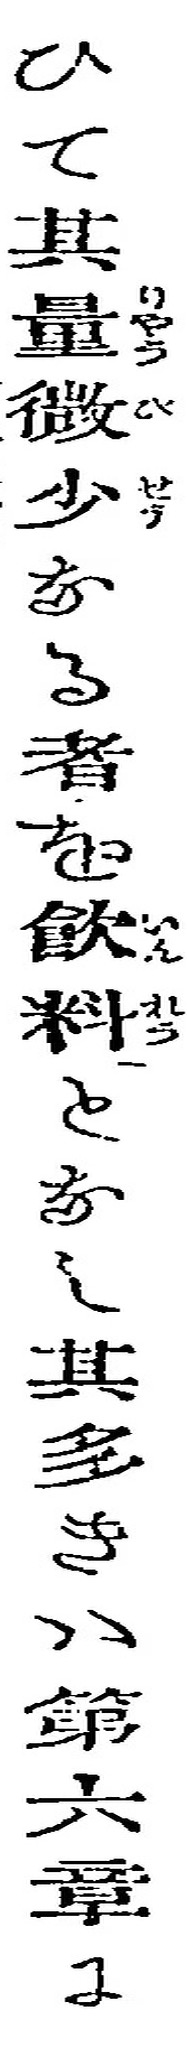ひて其量微少なる者を飲料となし其多きは第六章に
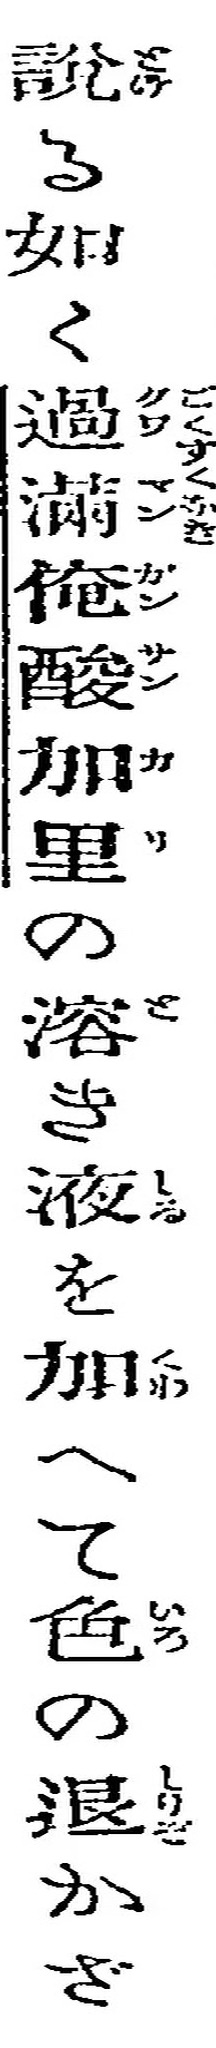説る如く過滿俺酸加里の溶き液を加へて色の退かざ
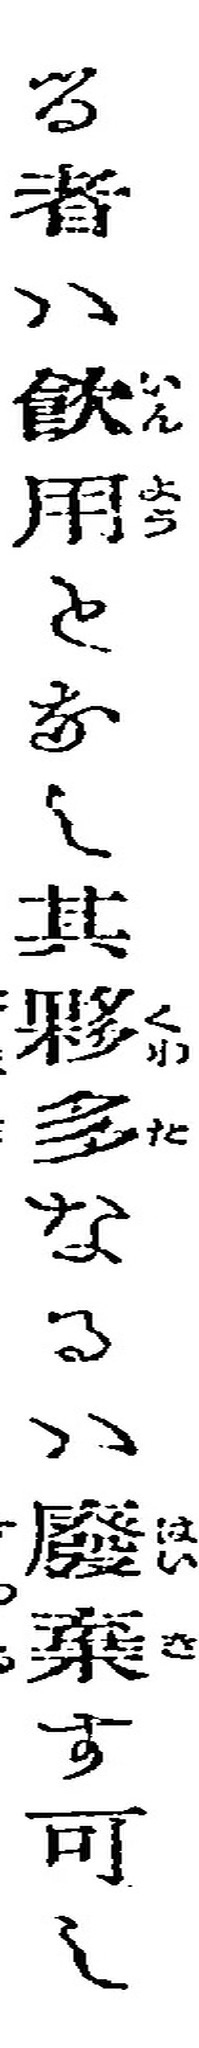る者は飲用となし其夥多なるは廃棄す可し
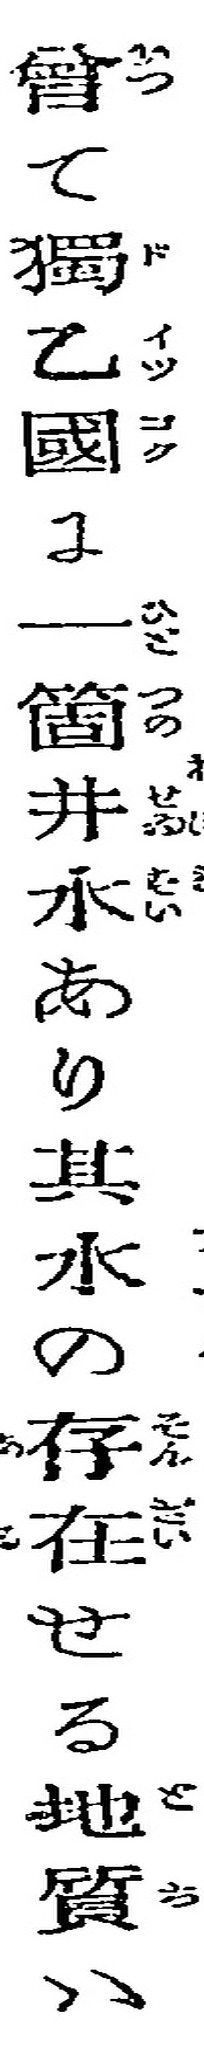曾て獨乙國ニ一箇井水あり其水の存在せる地質は
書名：飲水の心得 : 伝染病の予防
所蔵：国立国会図書館 National Diet Library, JAPAN
